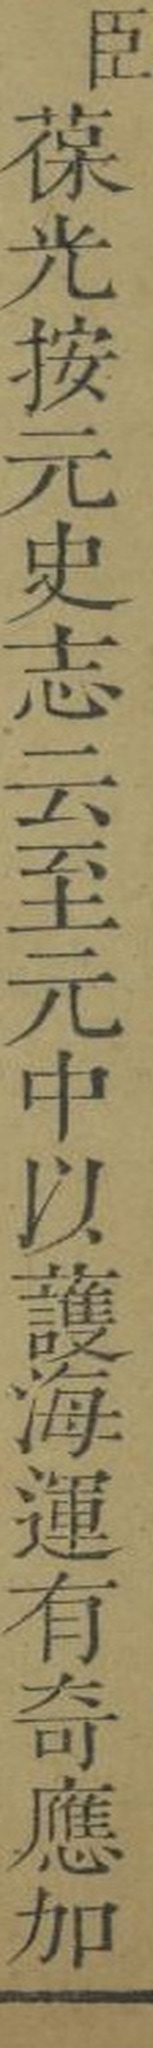臣葆光按元史志云至元中以䕶海運有奇應加
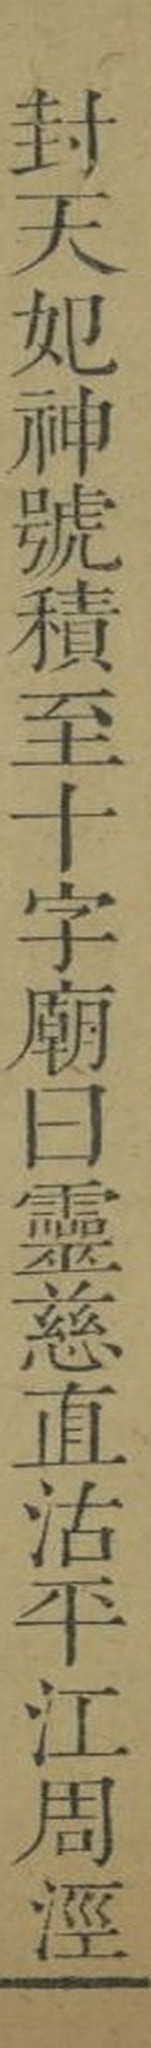封天妃神號積至十字廟曰靈慈直沽平江周涇
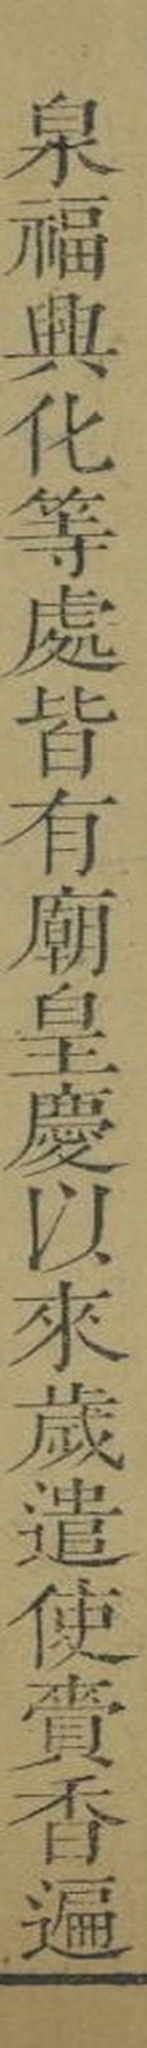泉福興化等處皆有廟皇慶以來歲遣使賫香遍
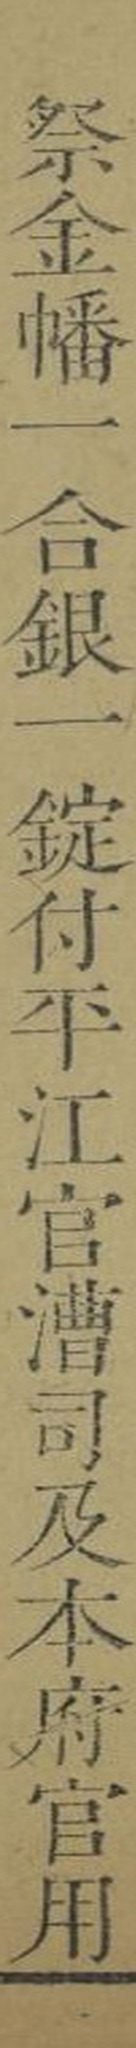祭金幡一合銀一錠付平江官漕司及本府官用
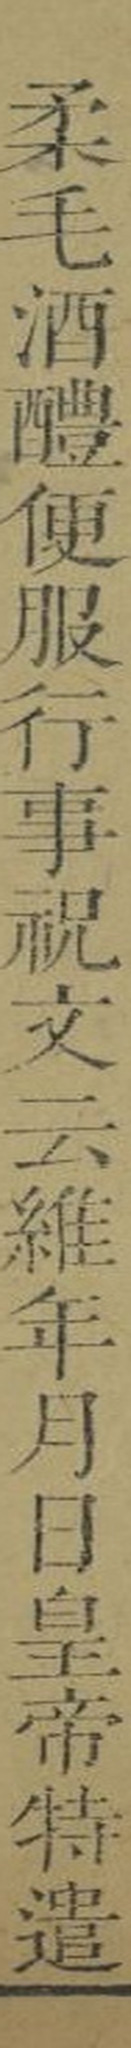柔毛酒醴便服行事祝文云維年月日皇帝特遣
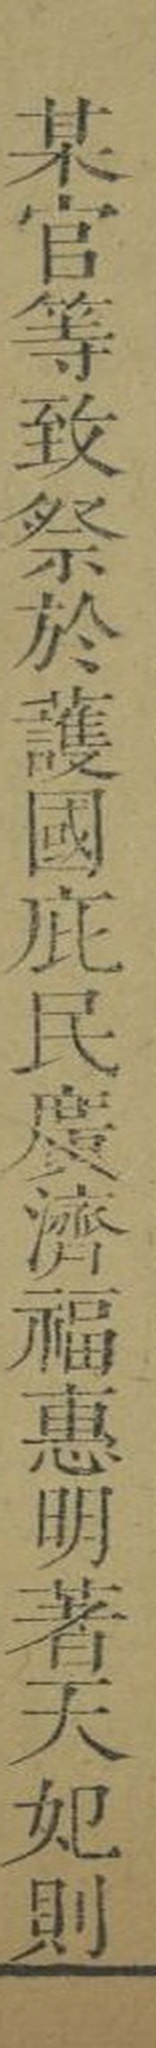某官等致祭於䕶國庇民廣濟福惠明著天妃則
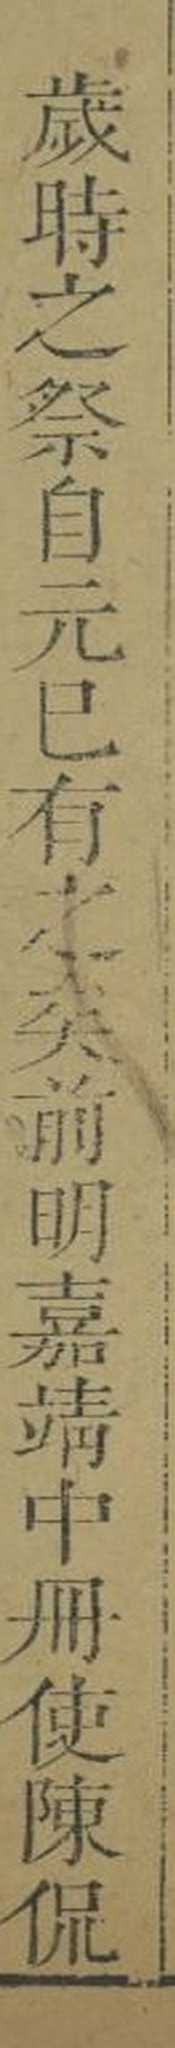歲時之祭自元巳有之矣前明嘉靖中冊使陳侃
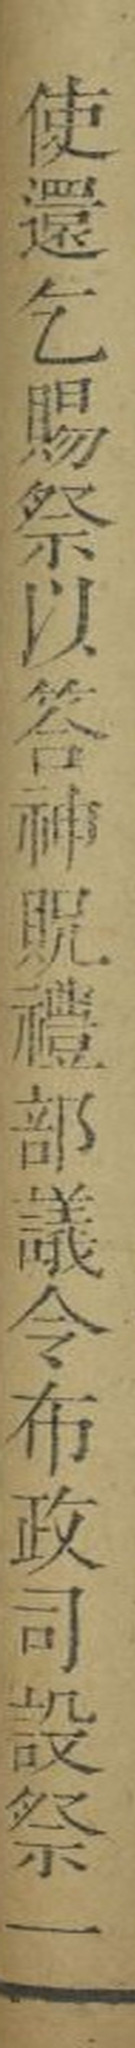使還乞賜祭以答神貺禮部議令布政司設祭一
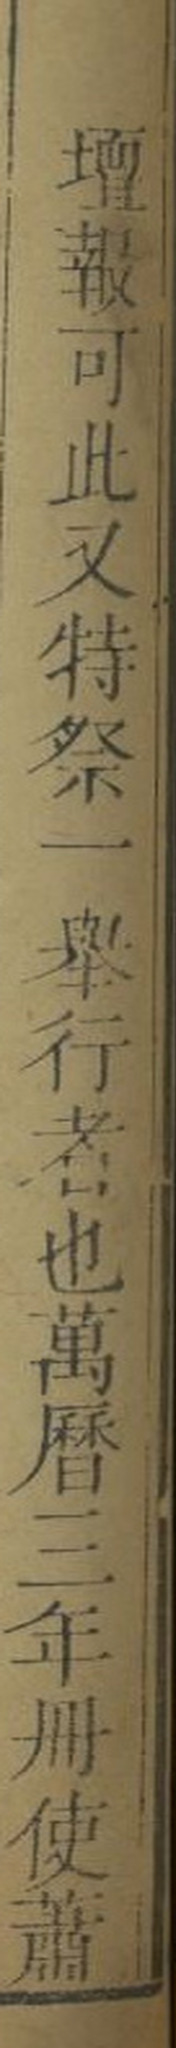壇報可此又特祭一舉行者也萬曆三年冊使蕭
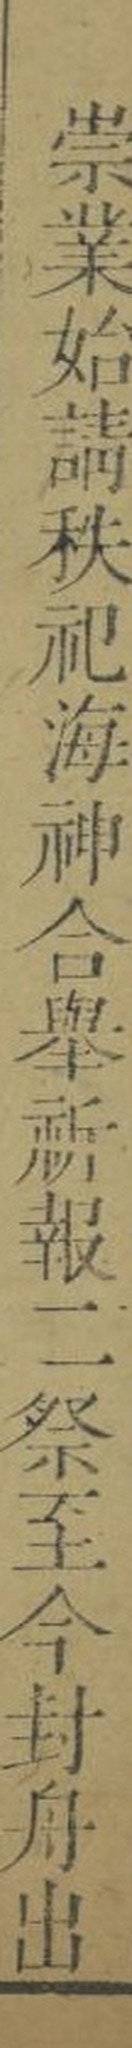崇業始請秩祀海神合舉祈報二祭至今封舟出
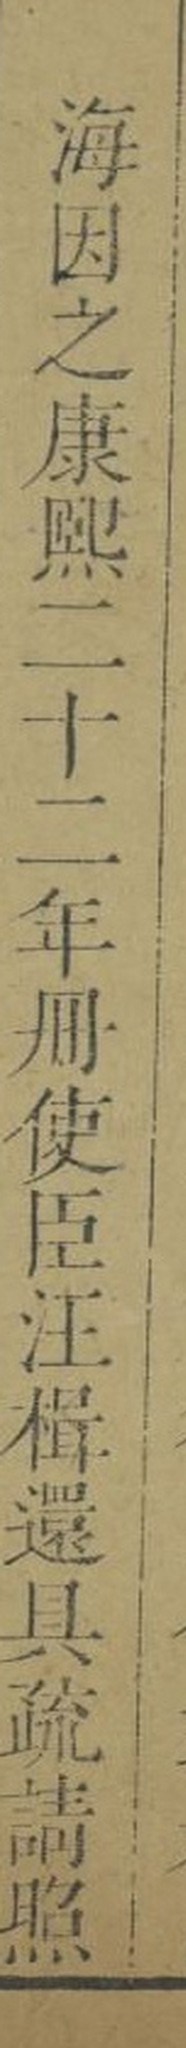海因之康熙二十二年冊使臣汪楫還具疏請照
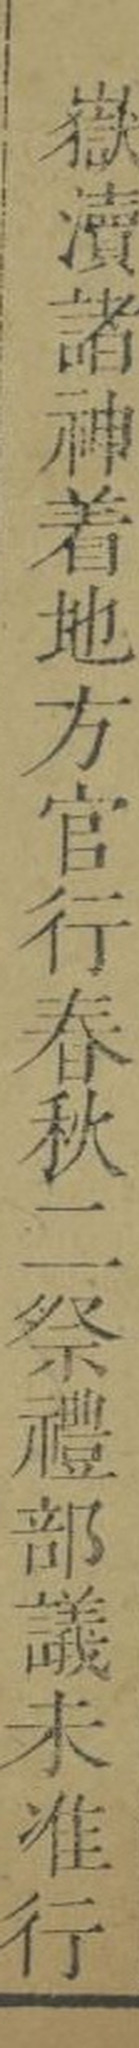嶽瀆諸神着地方官行春秋二祭禮部議未准行
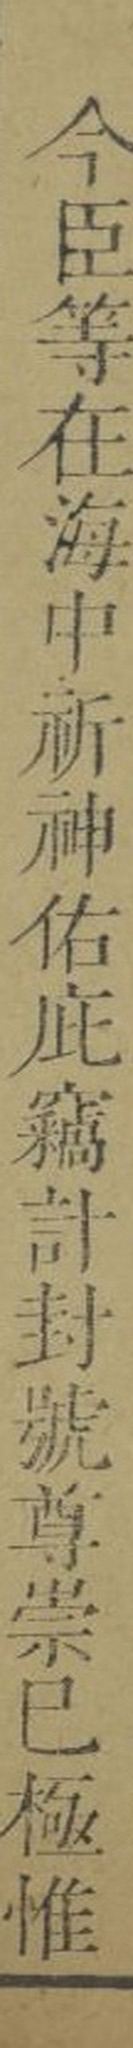今臣等在海中祈神佑庇竊計封號尊崇巳極惟
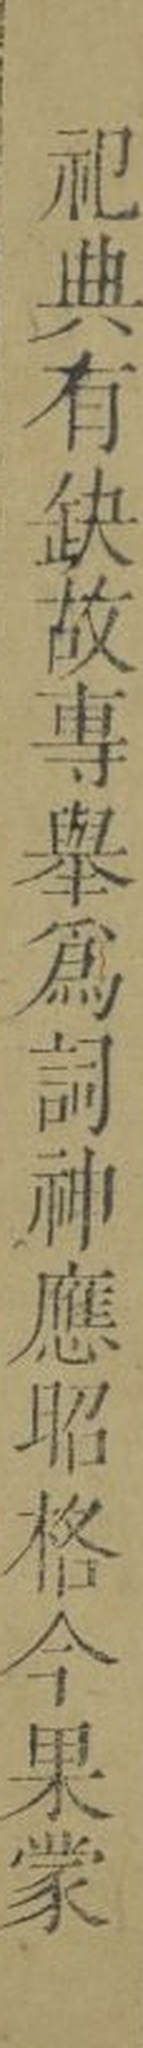祀典有欫故專舉爲詞神應昭格今果蒙
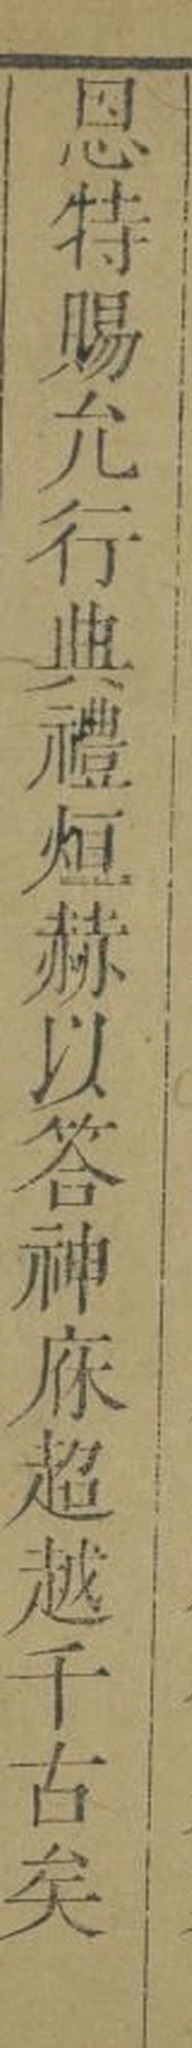恩特賜允行典禮烜赫以答神庥超越千古矣
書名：中山伝信録 巻一
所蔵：University of the Ryukyus Library
